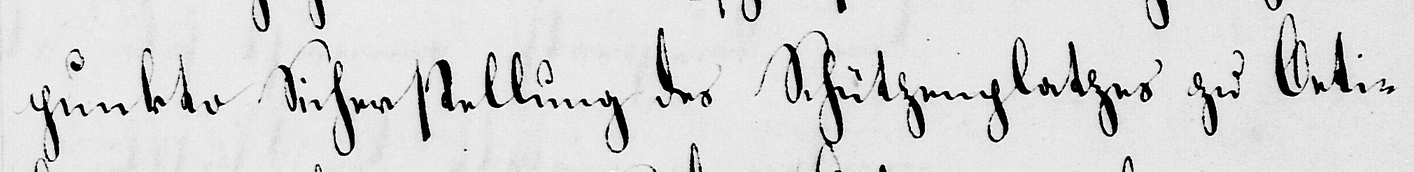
punkto Sicherstellung des Schützenplatzes zu Oeti¬
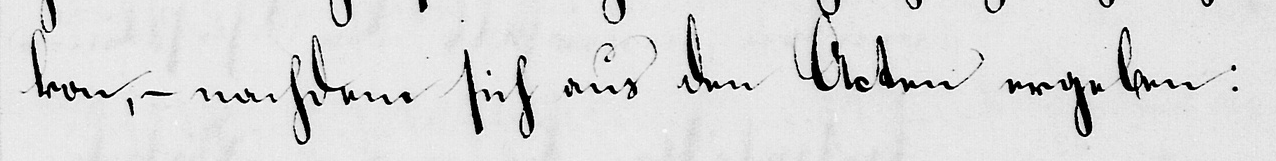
kon, – nachdem sich aus den Acten ergeben:
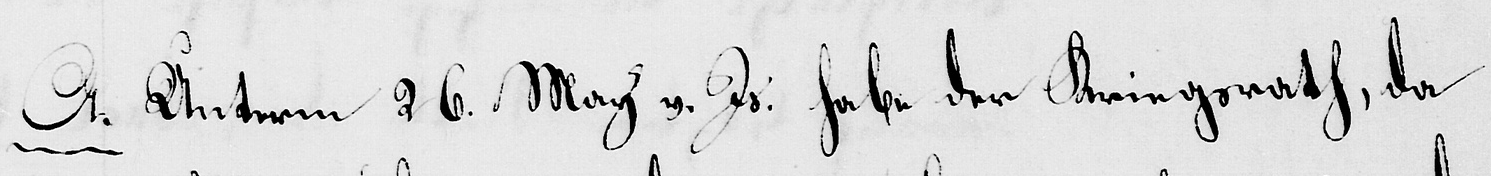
A. Unterm 26. May v. Js. habe der Kriegsrath, da
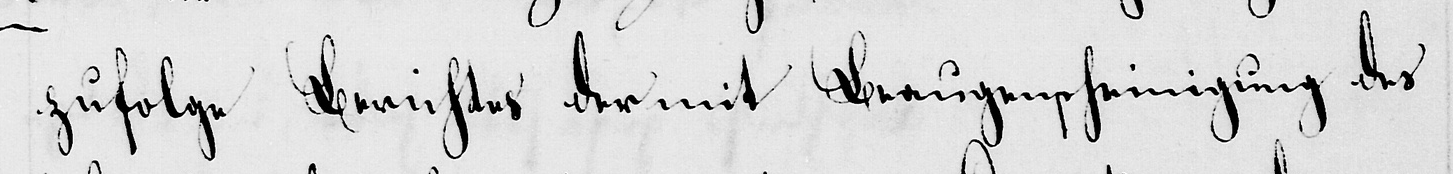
zufolge Berichtes der mit Beaugenscheinigung des
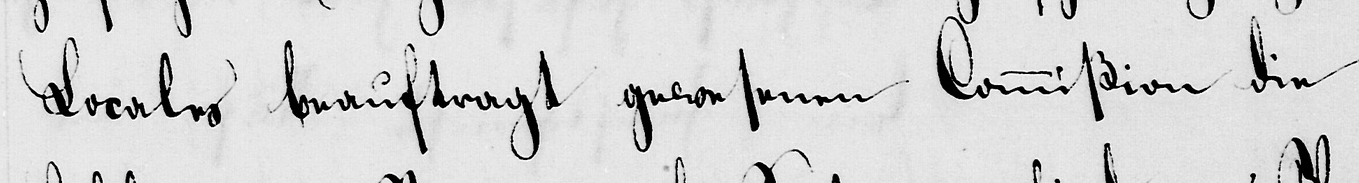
Locales beauftragt gewesenen Commißion die
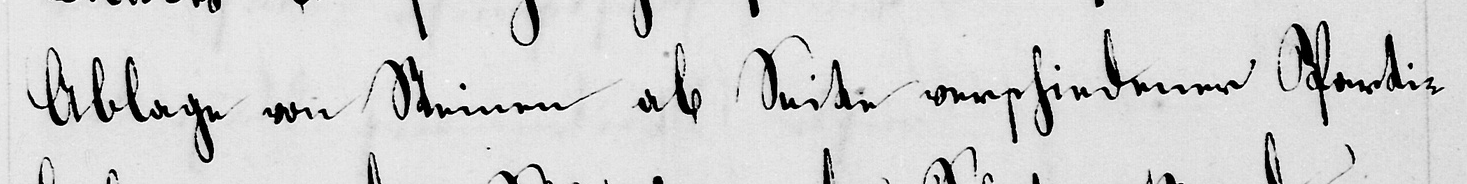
Ablage von Steinen ab Seite verschiedener Parti¬
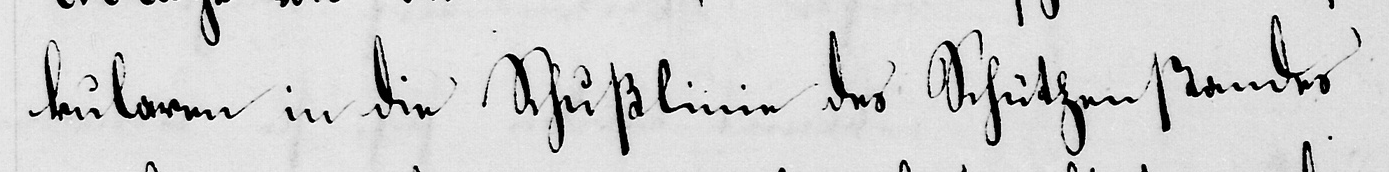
kularen in die Schußlinie des Schützenstandes
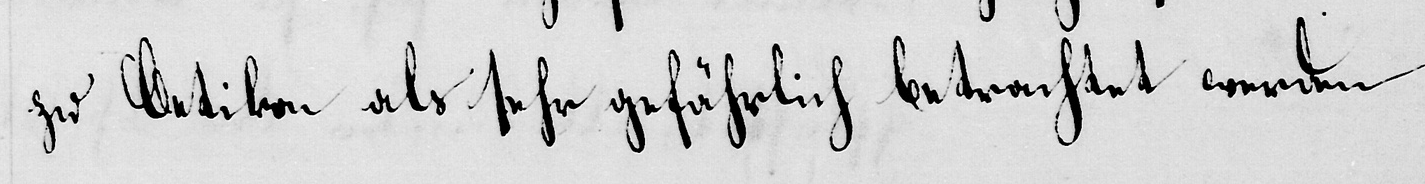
zu Oetikon als sehr gefährlich betrachtet werden
